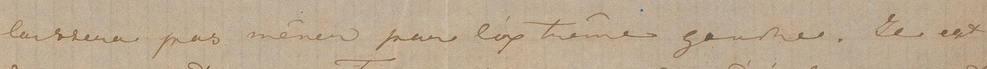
laissera pas mêner par l'extrême gauche. Il est
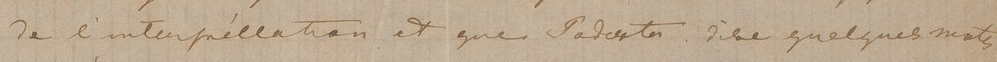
de l'interpéllation et que Podesta dise quelques mots
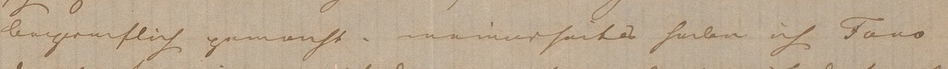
begreiflich gemacht – einerseits habe ich Fano
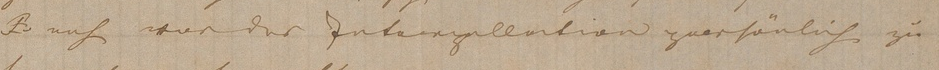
so noch vor der Interpellation persönlich zu
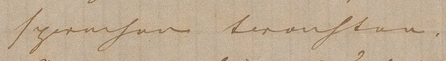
sprechen trachten. –
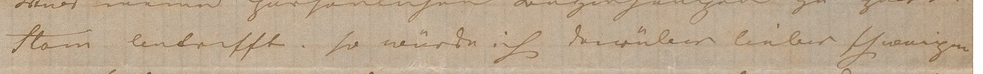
Stamm betrifft – so würde ich darüber lieber schweigen.
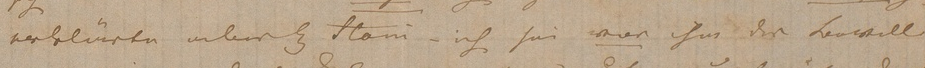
erklärte aber Herrn Stamm – ich sei vor ihm der Bevoll-
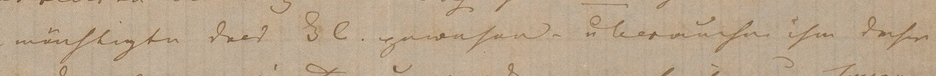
mächtigte des GC. gewesen – u brauche ihm daher
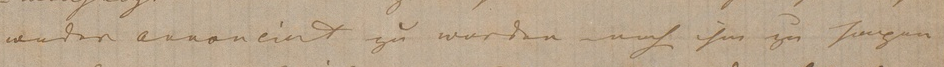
weder annoncirt zu werden – noch ihm zu sagen
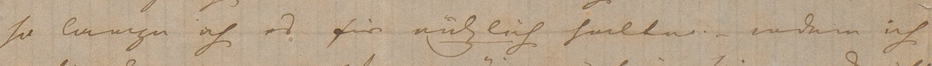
so lange ich es für nützlich halte – indem ich
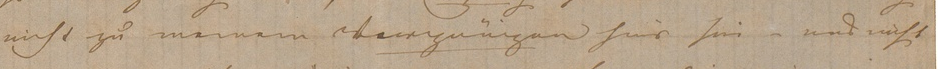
nicht zu meinem Vergnügen hier sei – und nicht
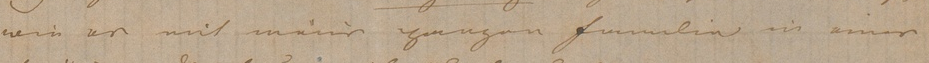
wie er mit meiner ganzen Familie in einer
